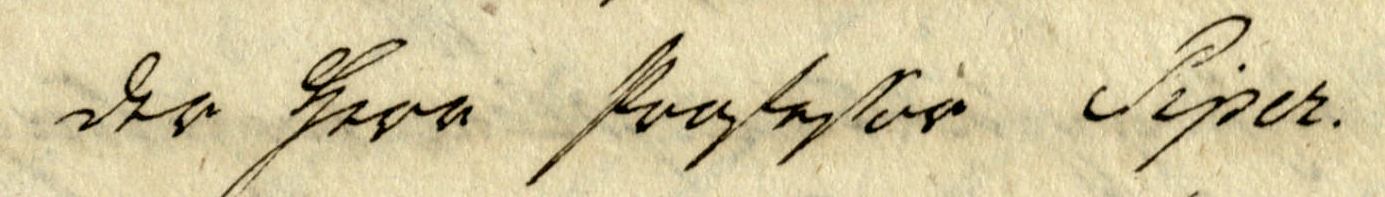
der Herr Professor Piper.
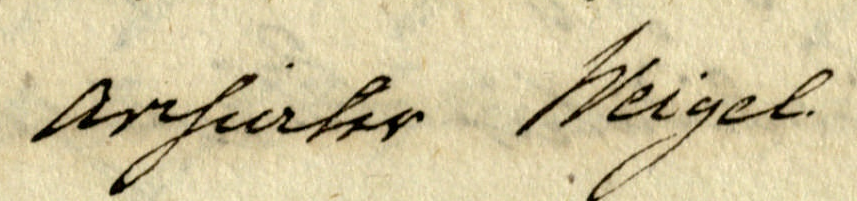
Archiater Weigel.
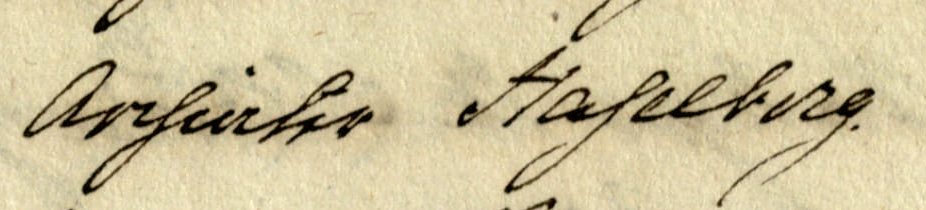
Archiater Haselberg.
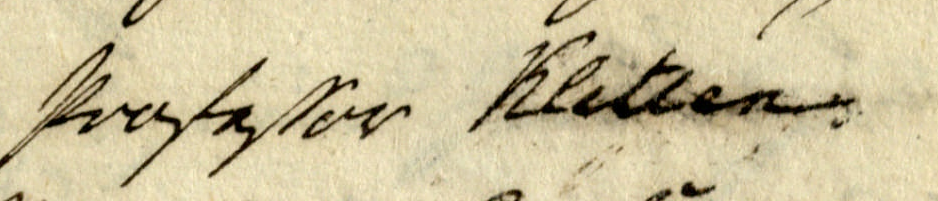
Professor Kletten.
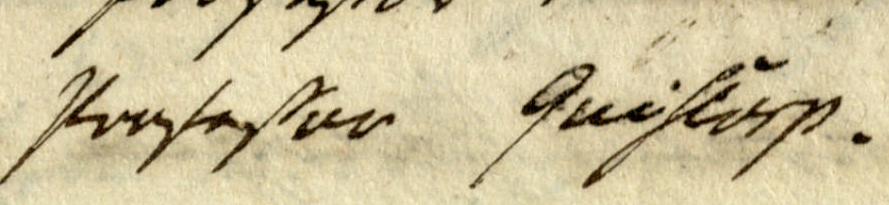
Professor Quistorp.
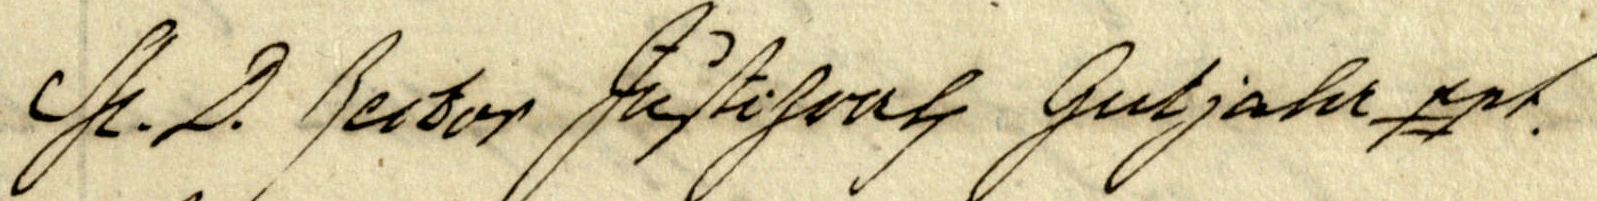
M. D. Rector Justizrath Gutjahr ppt.
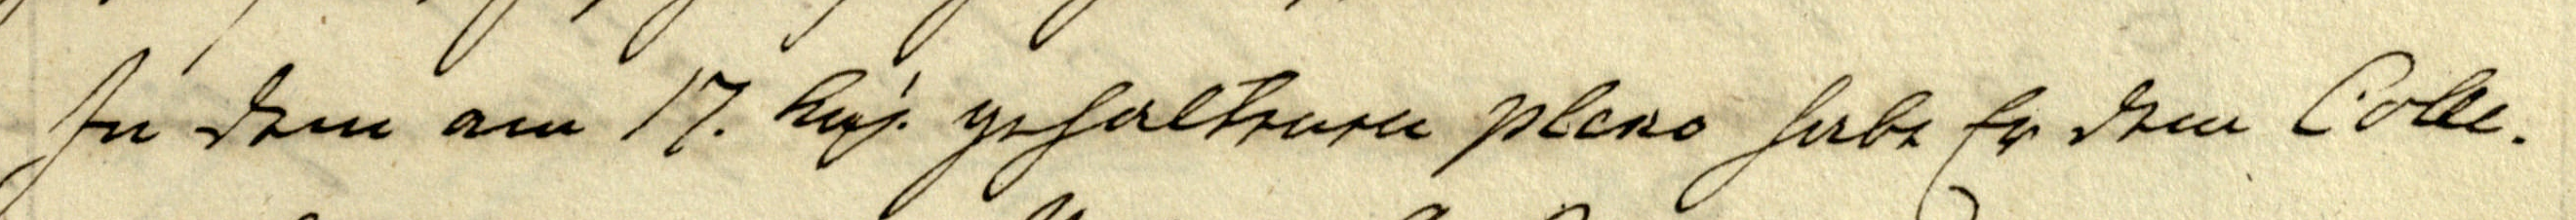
In dem am 17. huj. gehaltenen pleno habe Er dem Colle¬
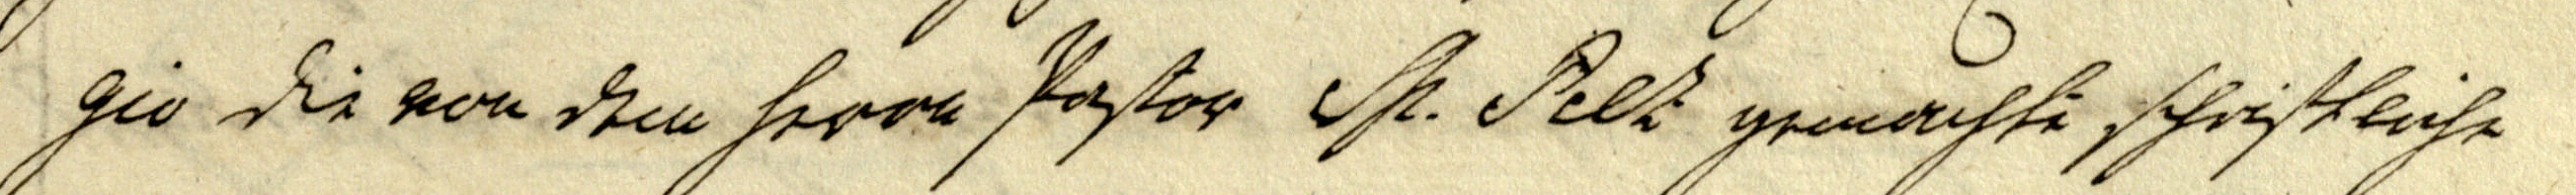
gio die von dem herrn Pastor M. Pelz gemachte schriftliche
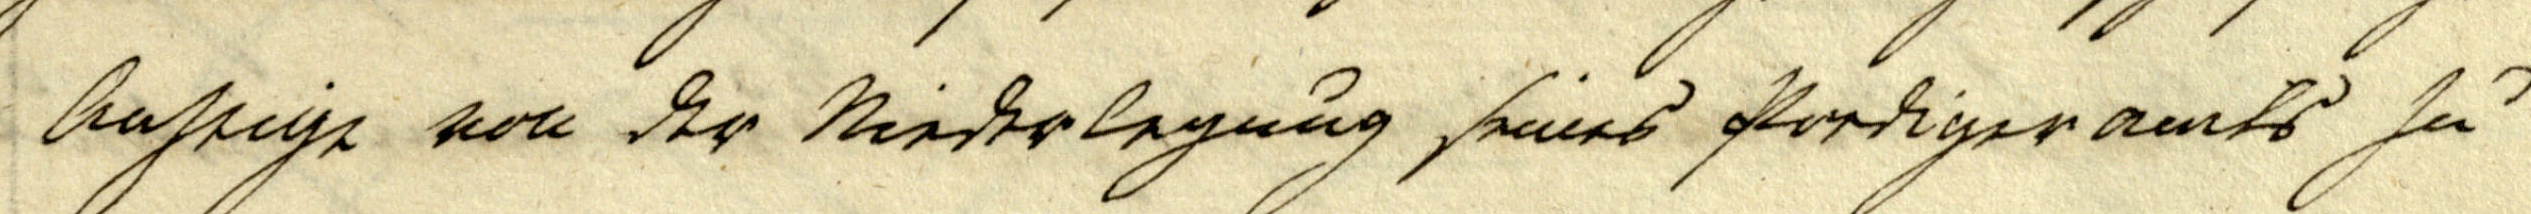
Anzeige von der Niederlegung seines Predigeramts zu
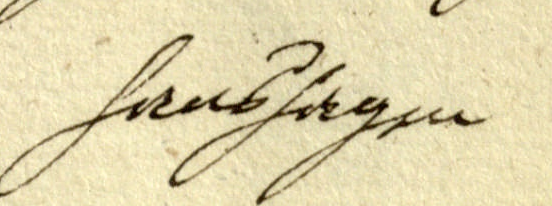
hanshagen
